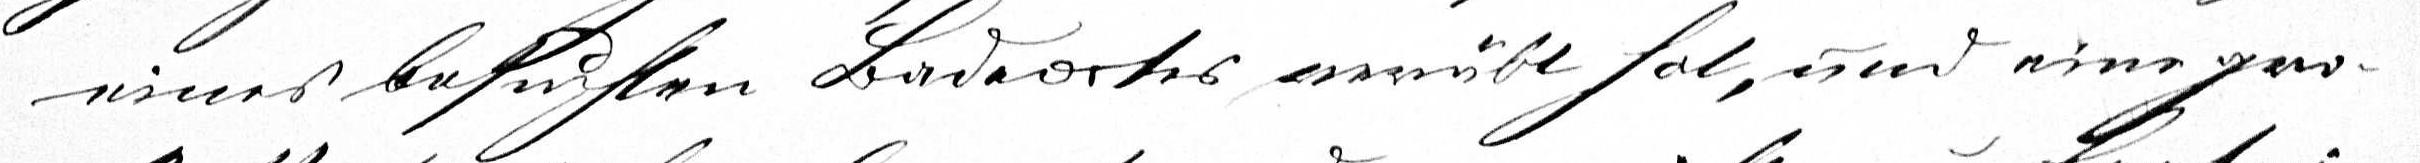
eines besuchten Badeortes verübt hat, und eine gro¬
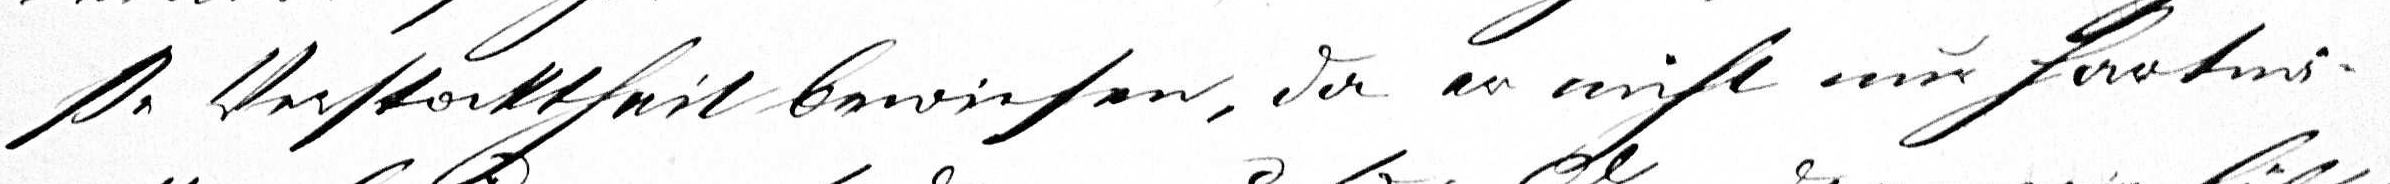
ße Verstocktheit bewiesen, da er nicht nur hartnä¬
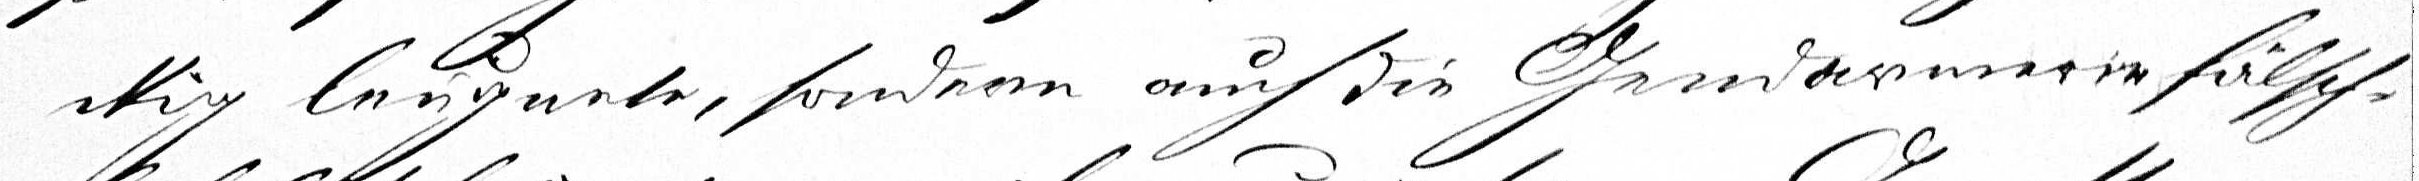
ckig leugnete, sondern auch die Gendarmerie fälsch¬
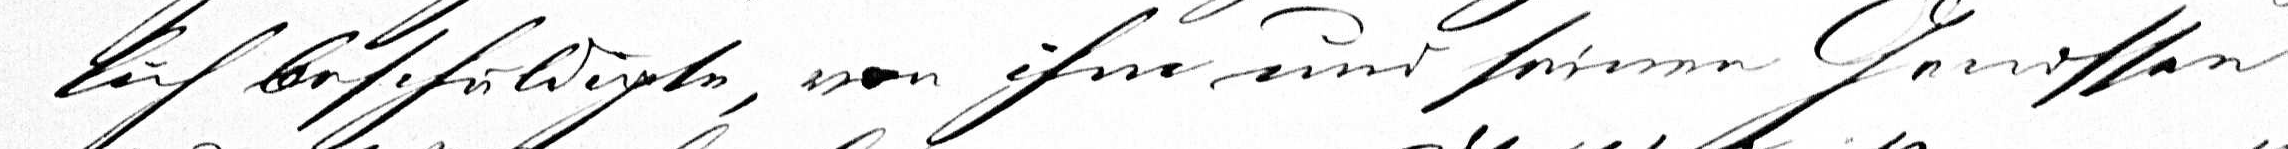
lich beschuldigte, von ihm und seine Genossen
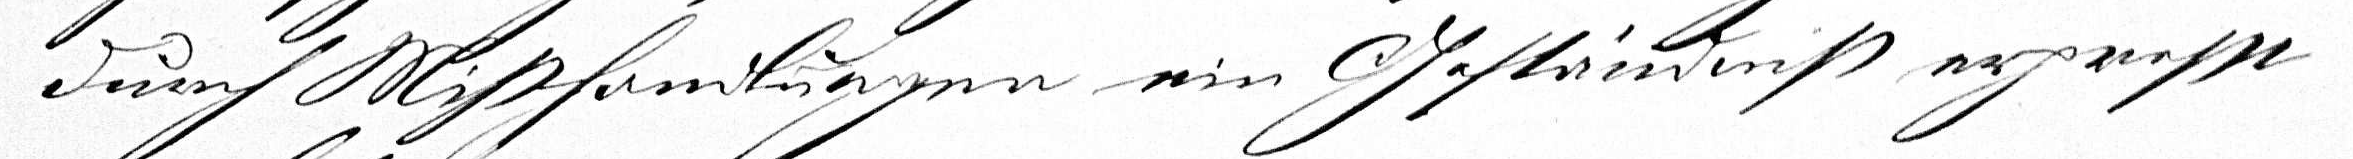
durch Mißhandlungen ein Geständniß erpreßt
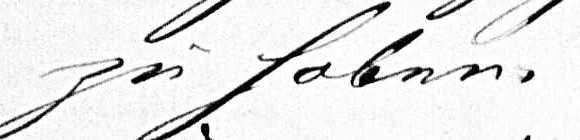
zu haben.
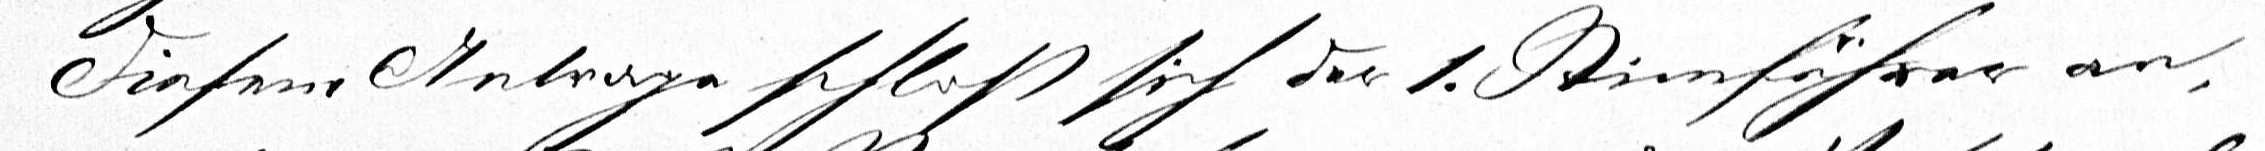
Diesem Antrage schloß sich der 1. Stimmführer an,
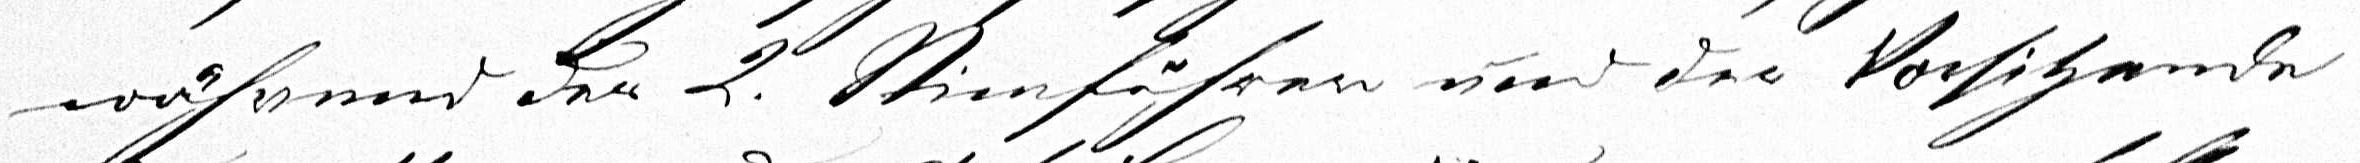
während der 2. Stimmführer und der Vorsitzende
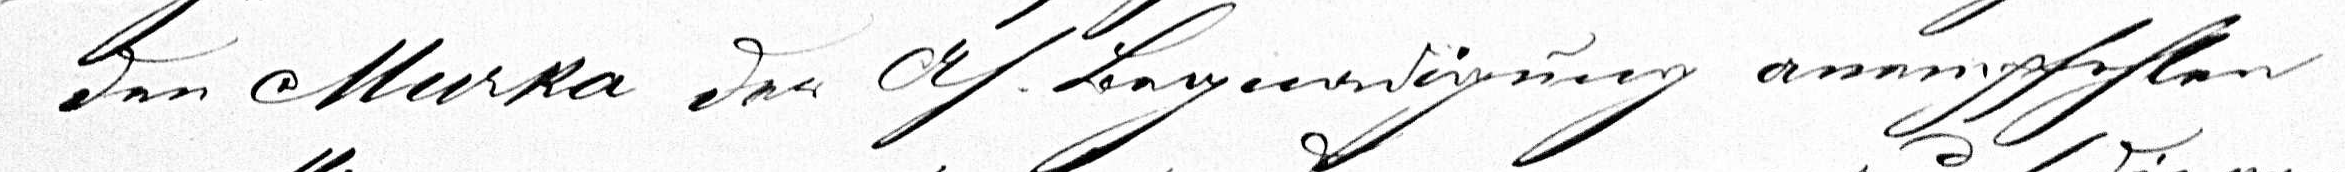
den Murka der Ah. Begnadigung anempfehlen
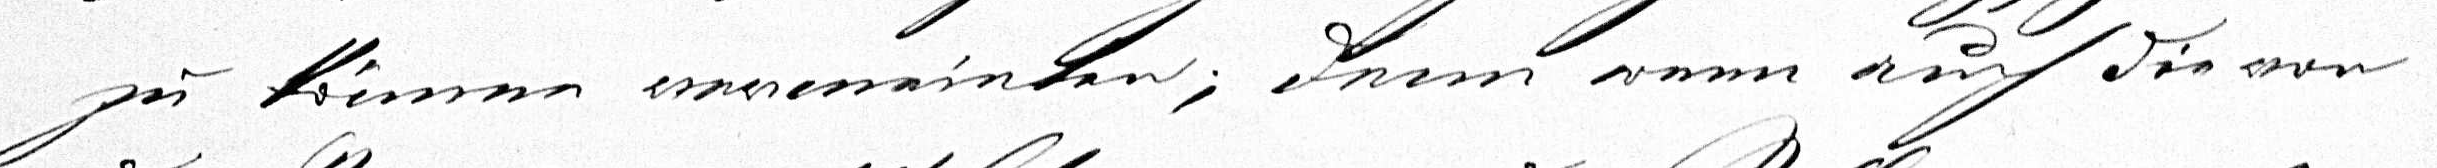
zu können vermeinten; denn wenn auch die von
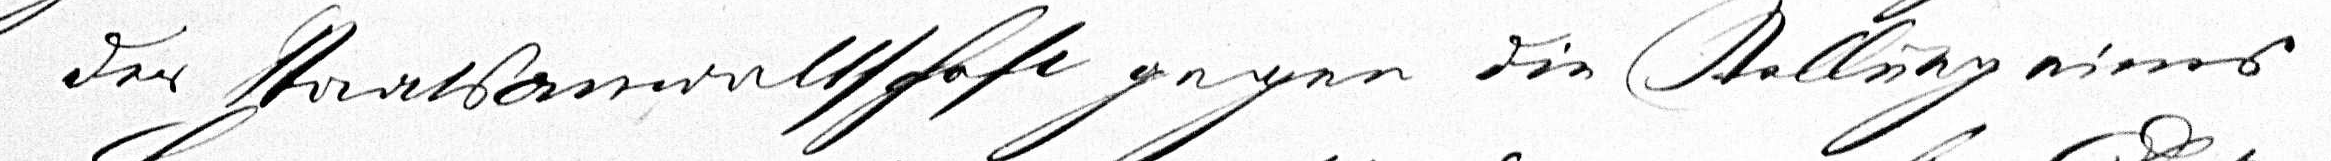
der Staatsanwaltschaft gegen die Stellung eines
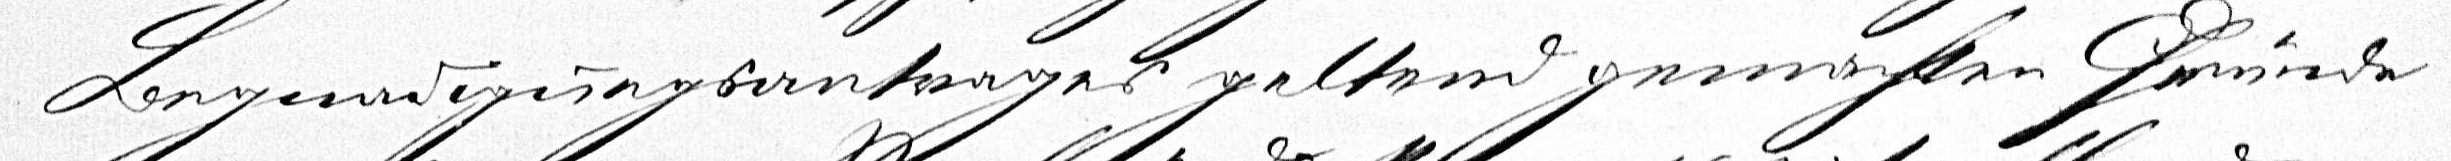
Begnadigungsantrages geltend gemachten Gründe
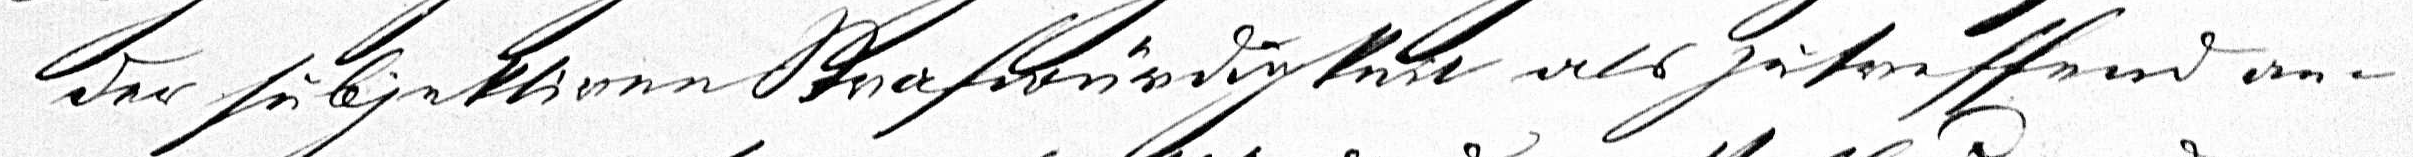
der subjektiven Strafwürdigkeit als zutreffend an¬
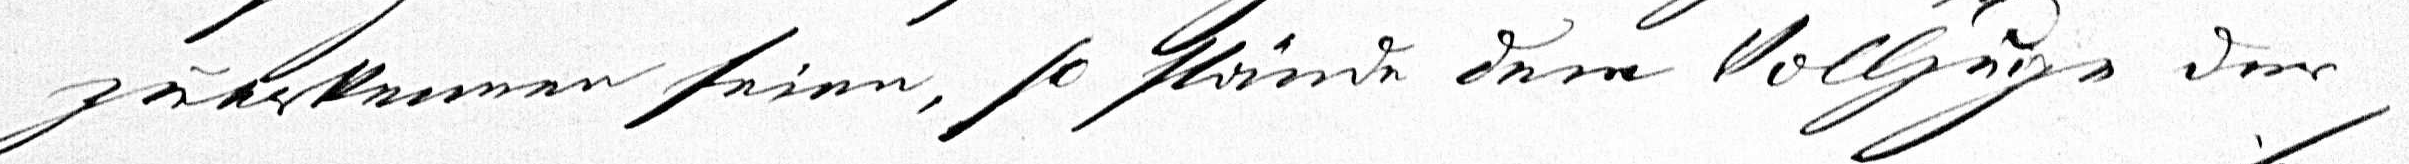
zuerkennen seien, so stände dem Vollzuge der
